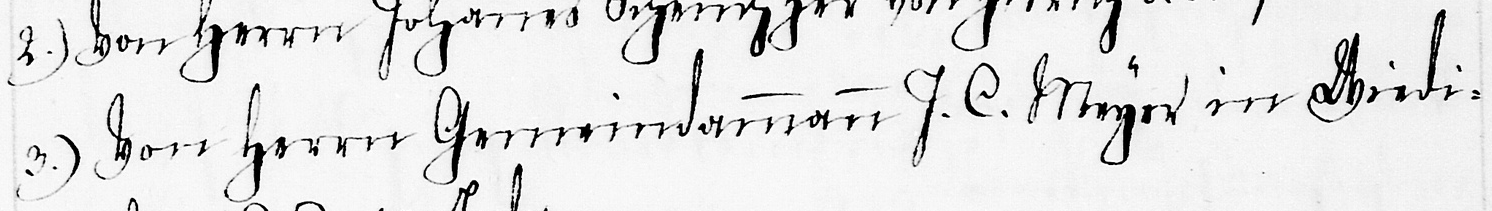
3.) Von Herrn Gemeindammann J. C. Meyer in Wiedi¬
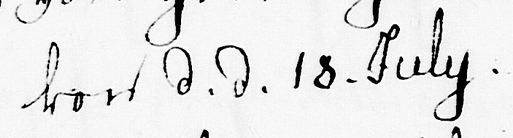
kon d. d. 18. July.
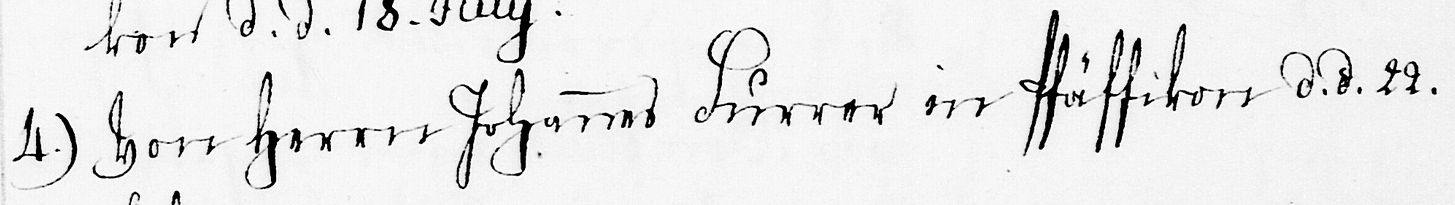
4.) Von Herrn Johannes Furrer in Pfäffikon d. d. 22.
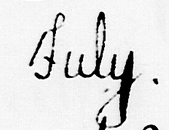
July.
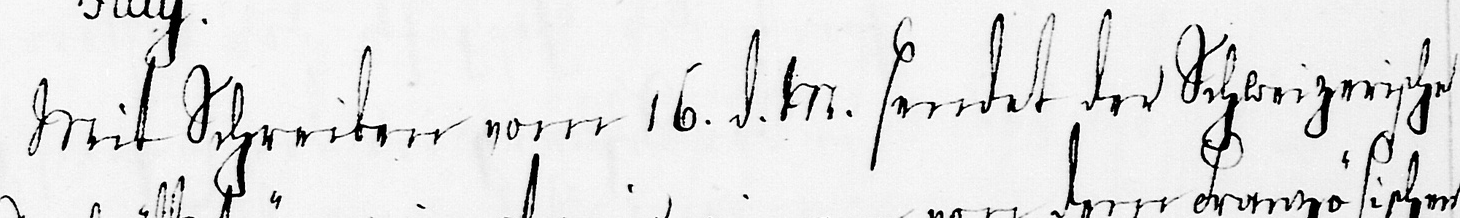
Mit Schreiben vom 16. d. M. sendet der Schweizerische
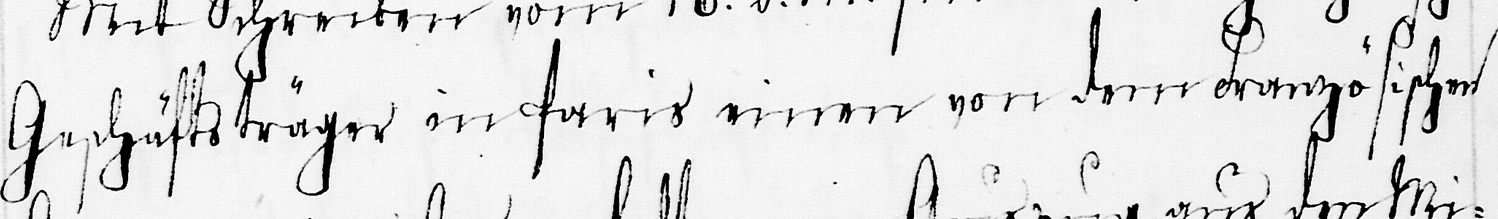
Geschäftsträger in Paris einen von dem Französischen
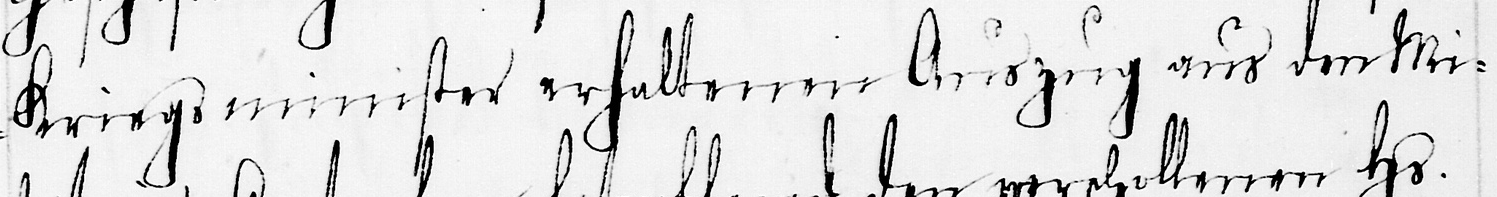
Kriegsminister erhaltenen Auszug aus den Mi¬
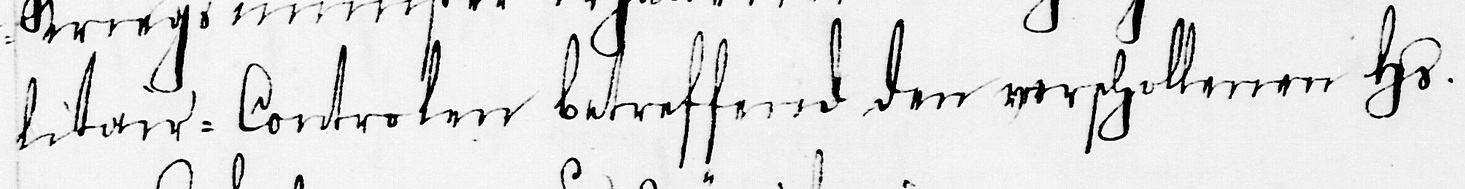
litair-Controlen betreffend den verschollenen Hs.
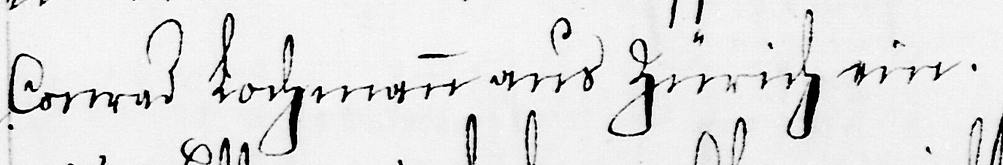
Conrad Lochmann aus Zürich ein.
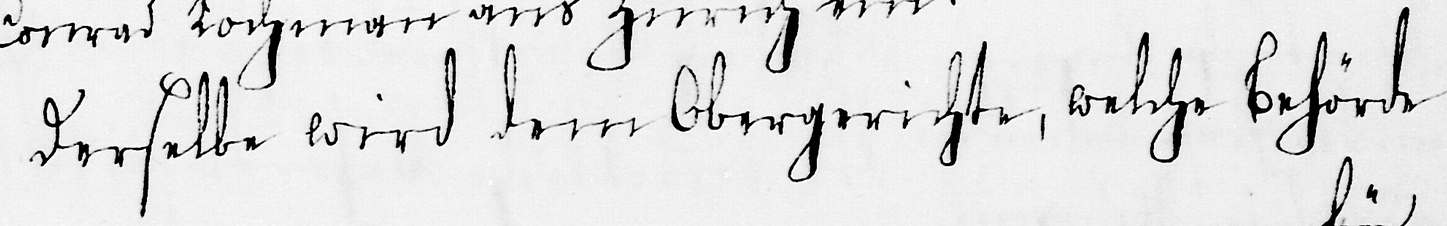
Derselbe wird dem Obergerichte, welche Behörde
